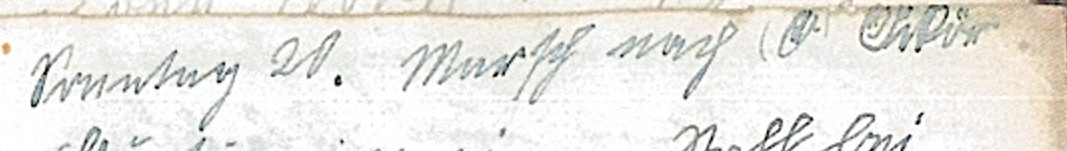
Sonntag 20. Marsch nach xx
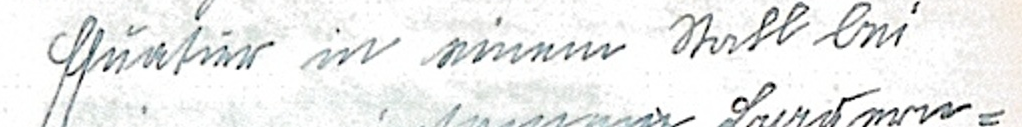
Quartier in einem Stall bei
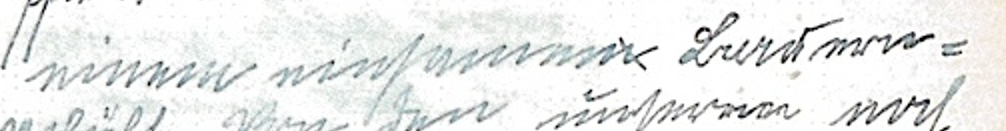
einem einsamen Bauern-
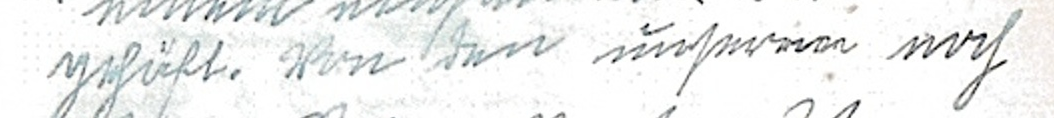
gehöft. Von den unseren noch
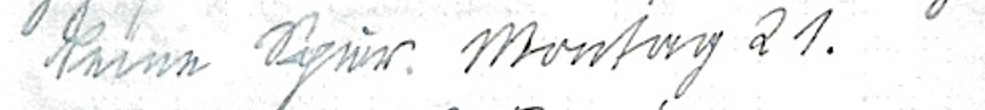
keine Spur. Montag 21.
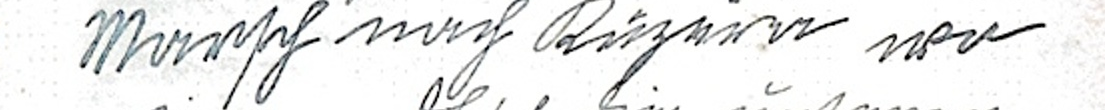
Marsch nach Kuzmin wo
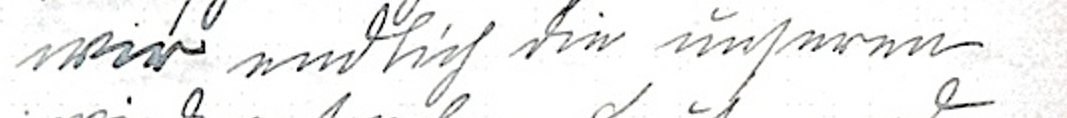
wir endlich die unseren
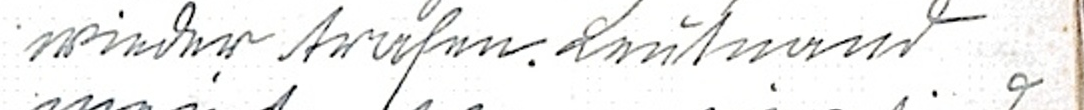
wieder trafen. Leutnand
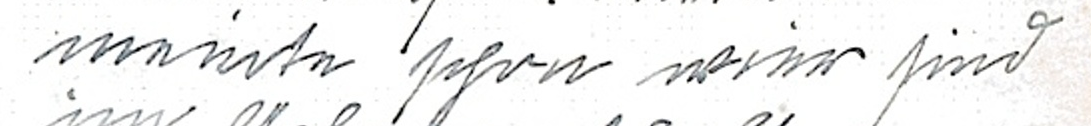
meinte schon wir sind
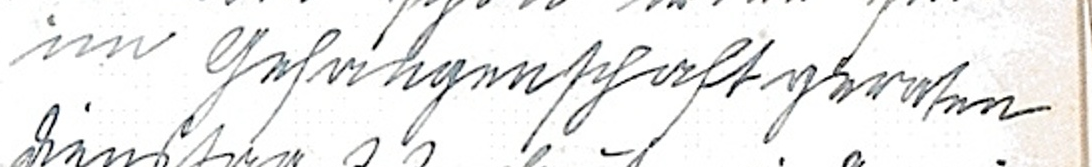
in Gefangenschaft geraten
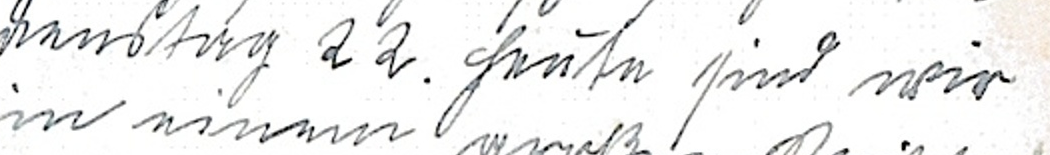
Dienstag 22. Heute sind wir
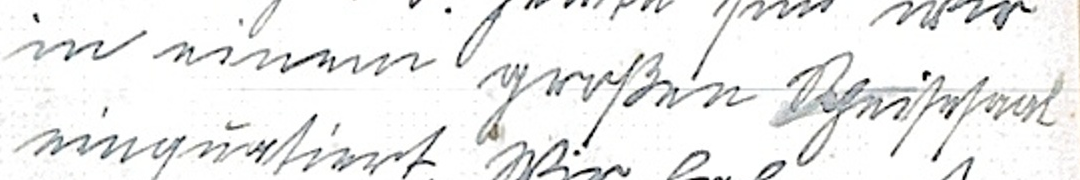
in einem großen xxsaal
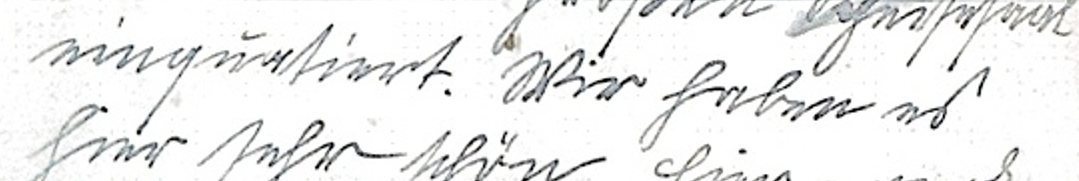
einquartiert. Wir haben es
